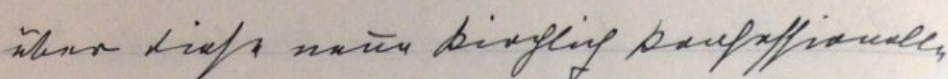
über diese neue kirchlich konfessionelle
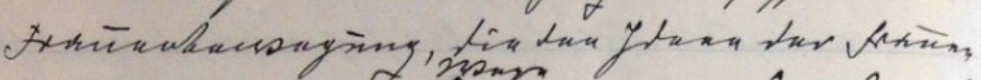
Frauenbewegung, die der Ebene der Frauen
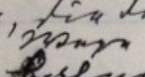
Wege
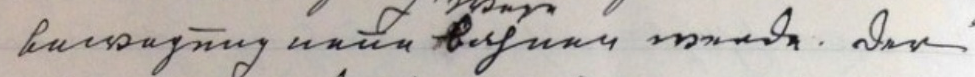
bewegung neue bahnen werde. Der
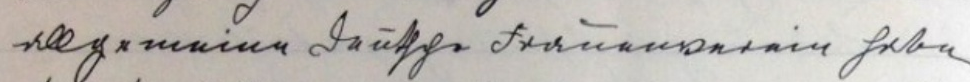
Der allgemeine deutsche Frauenverein habe
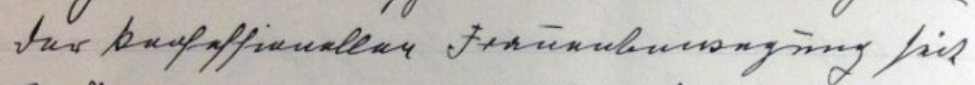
der konfessionellen Frauenbewegung seit
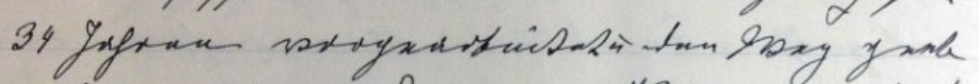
34 Jahren vorgearbeitet u. den Weg geeb
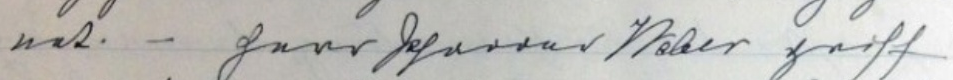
net. - Herr Pfarrer Weber griff
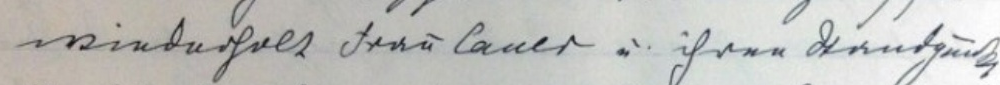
wiederholt Frau Cauer u. ihren Hand
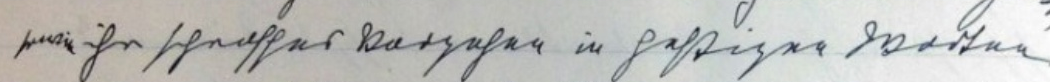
griff ihr schroffes Vorgehen in hastigen Worten
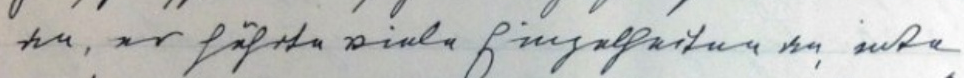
an, er führte viele Einzelheiten an, inte
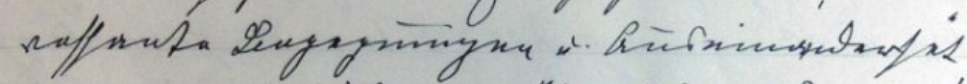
interessante Begegnungen u. Auseinanderset
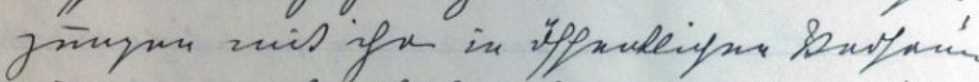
zungen mit ihr in öffentlichen Versamm
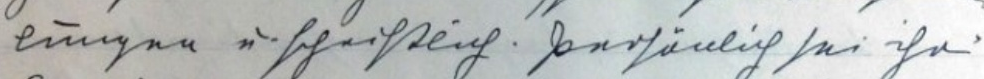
lungen u. schriftlich. Persönlich sei ihr
